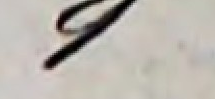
9
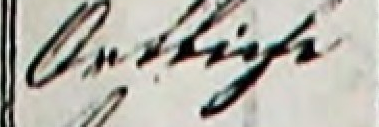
Örtliche
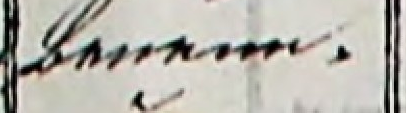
Benenn„
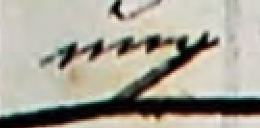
ung
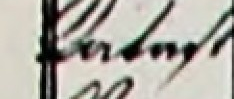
Katast
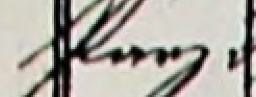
Parz
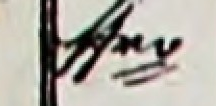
Hnr
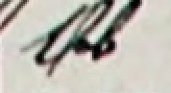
Ob
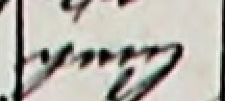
ganz
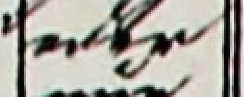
oder
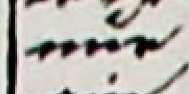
nur
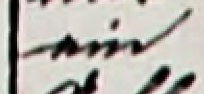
ein
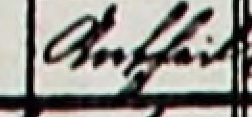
Antheil
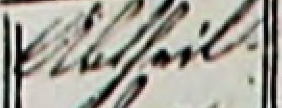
Abthei.
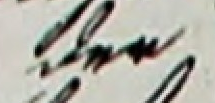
der
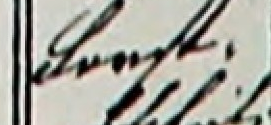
Fanst„
